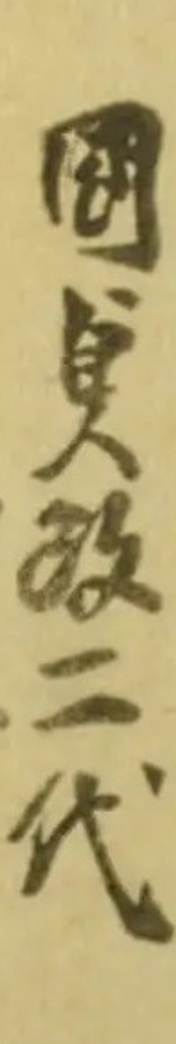国貞改二代
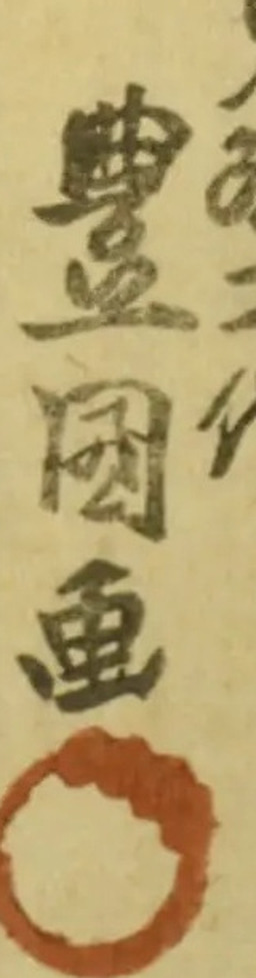豊国画
